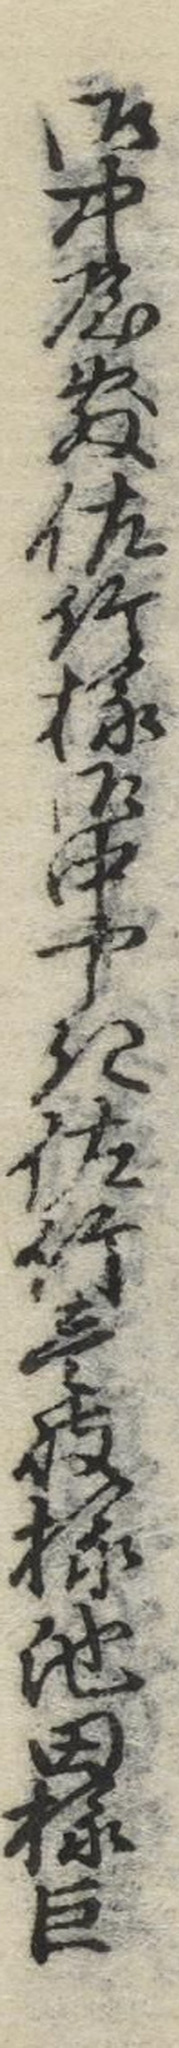御中屋敷佐竹様御中やしき佐竹壱岐様池田様巨
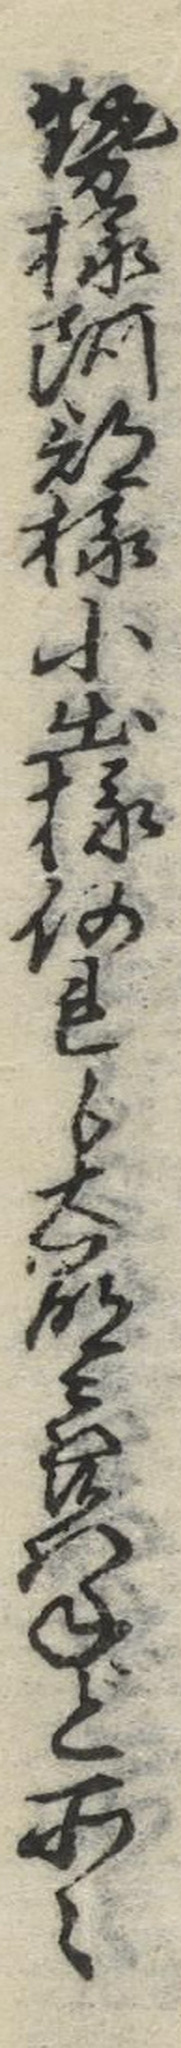勢様阿部様小出様何れも大崩ニハ候ハねど所〻
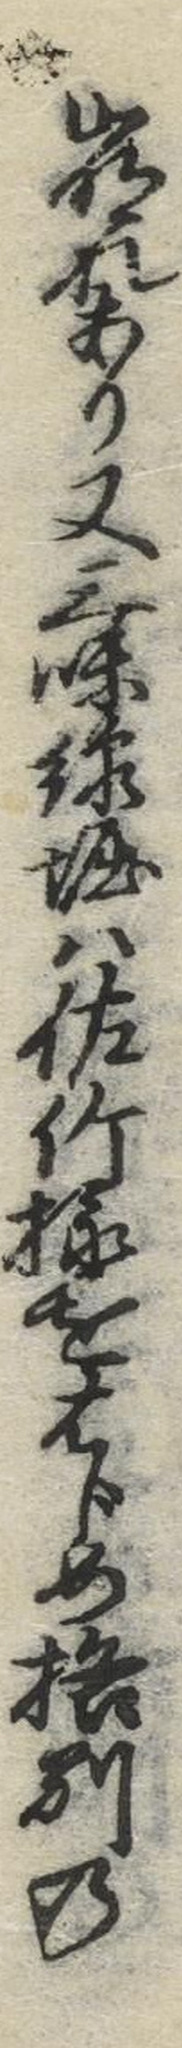崩れあり又三味線堀ハ佐竹様をはじめ格別の
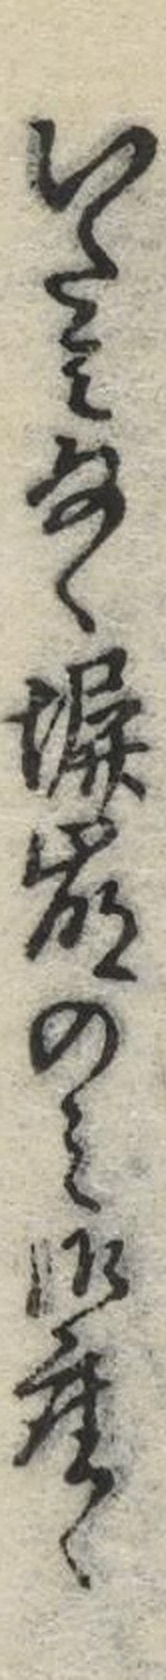いたミなく塀崩のミ御座候
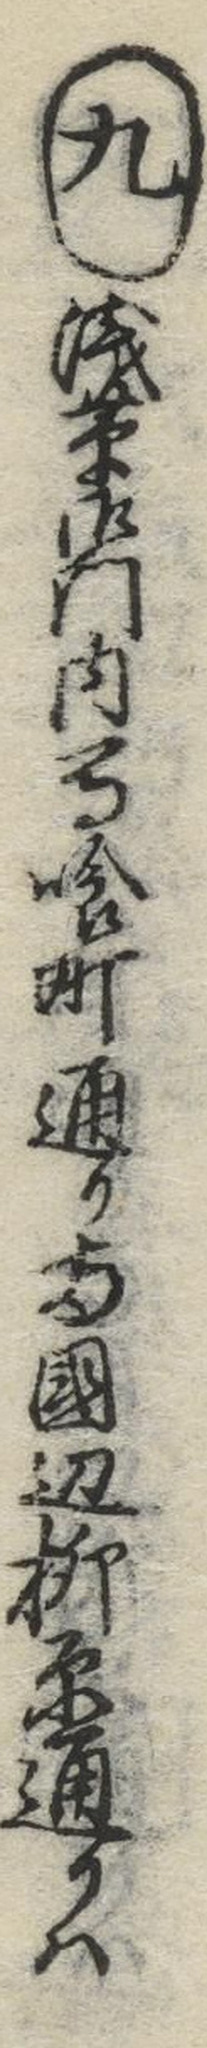九浅草御門内馬喰町通り両国辺柳原通りハ
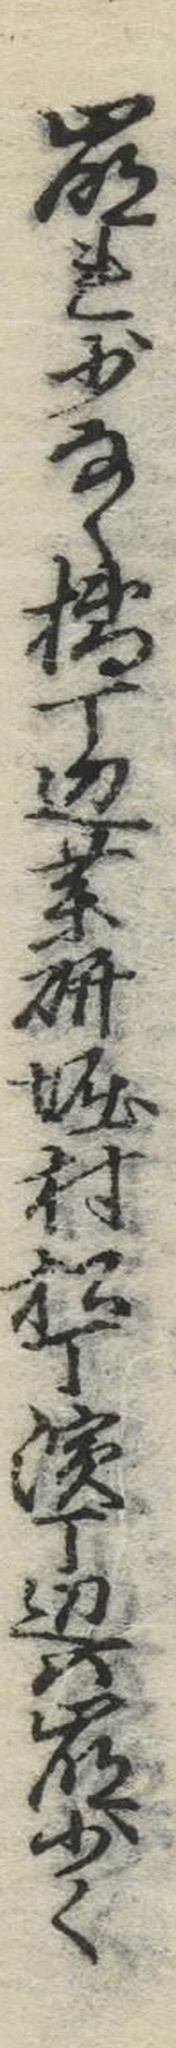崩れ少なく橋丁辺薬研堀村松丁濱丁辺ハ崩少く
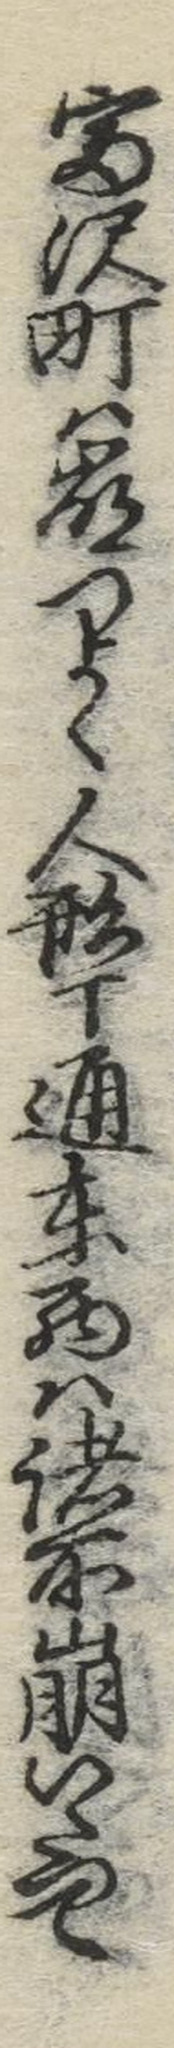富沢町ハ崩つよく人形丁通東西ハ諸所崩いたつて
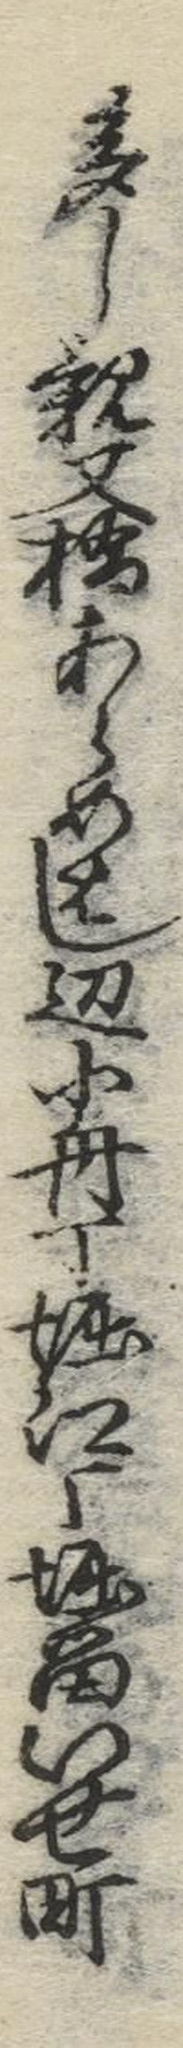多し親父橋あらめはし辺小舟丁堀江丁堀留いせ町
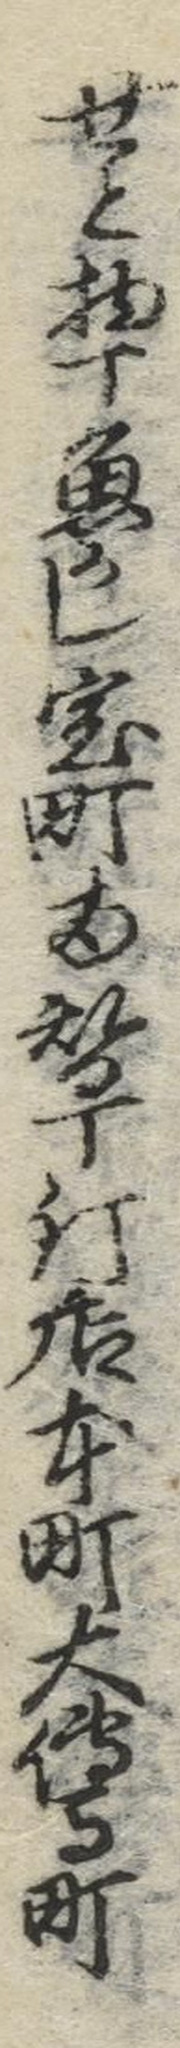せと物丁魚かし宝町両替丁釘店本町大傳馬町
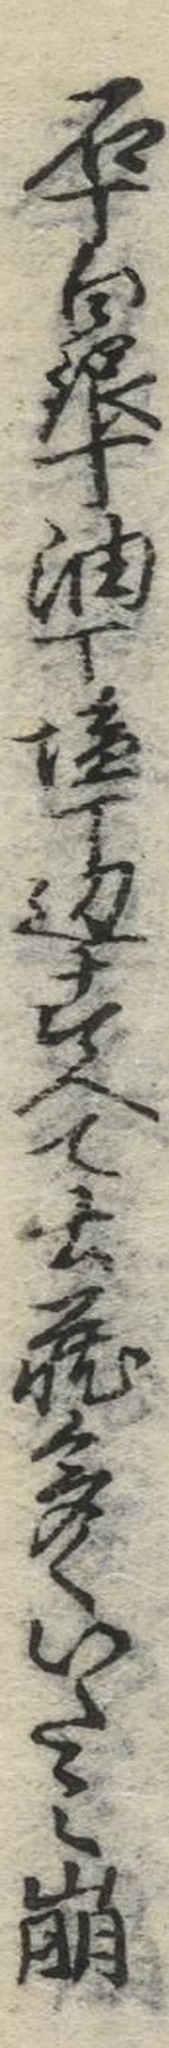石丁白銀丁油丁塩丁辺すへて土蔵多くいたミ崩
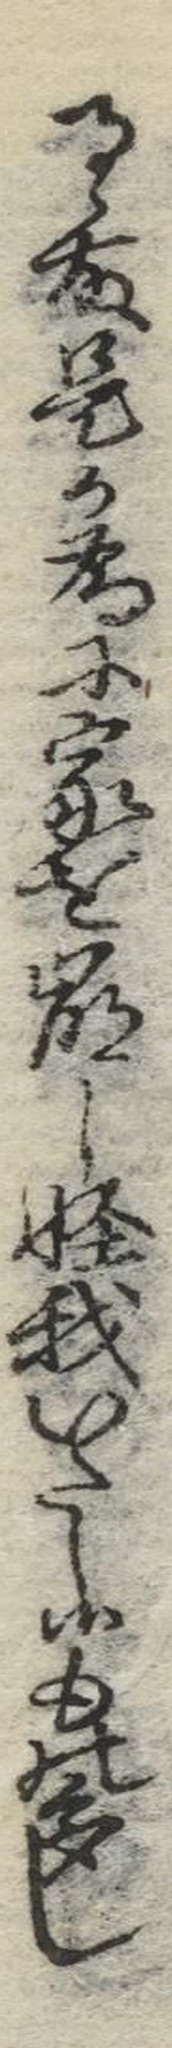るゝ故是か為に家を崩し怪我いたし候もの多し
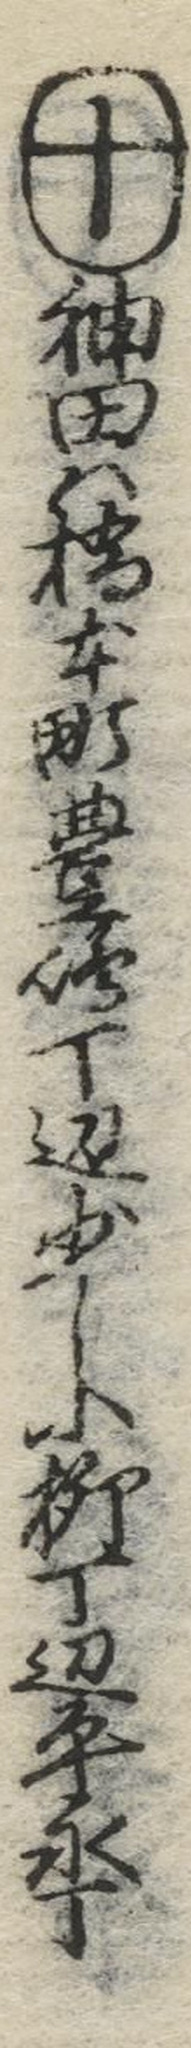十神田ハ橋本町豊嶋丁辺少し小柳丁辺平永丁
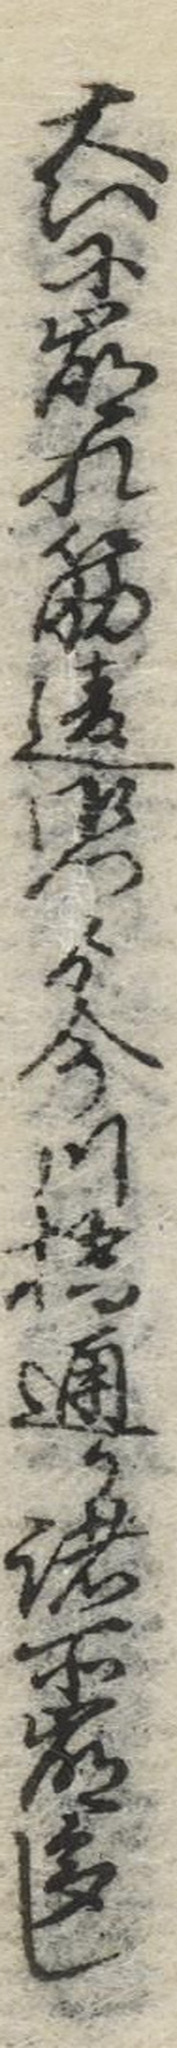大いに崩れ筋違御門ゟ今川橋通り諸所崩多し
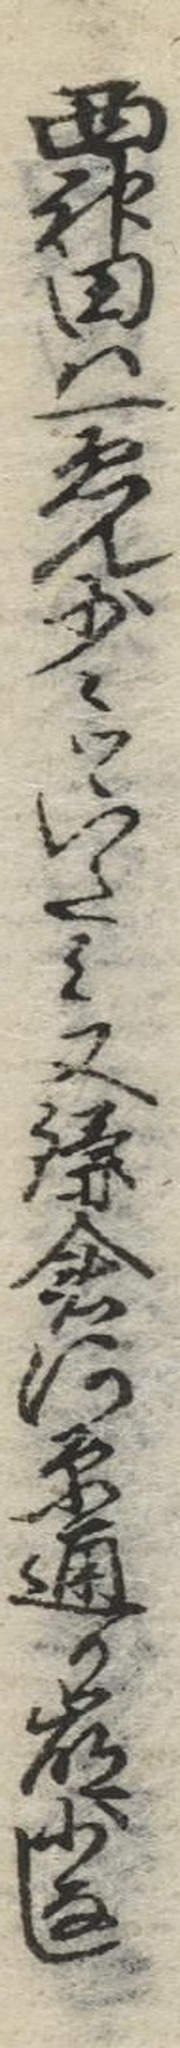西神田ハ一めん少〻ツヽいたミ又鎌倉河原通り崩少なし
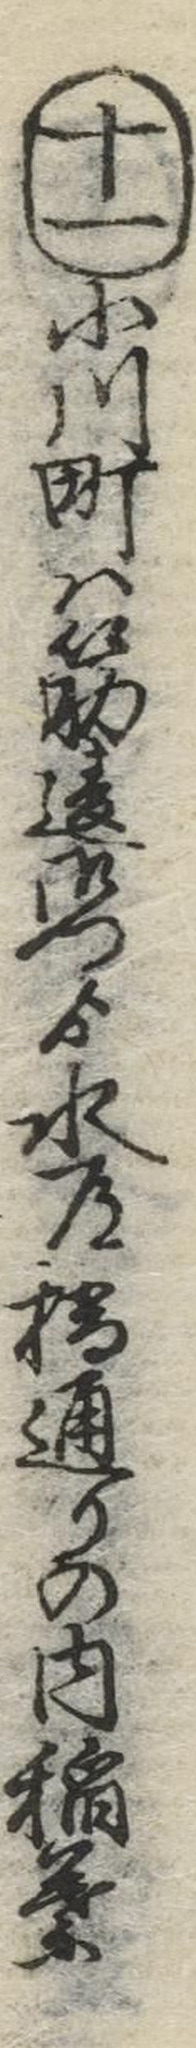十一小川町ハ筋違御門ゟ水道橋通りの内稲葉
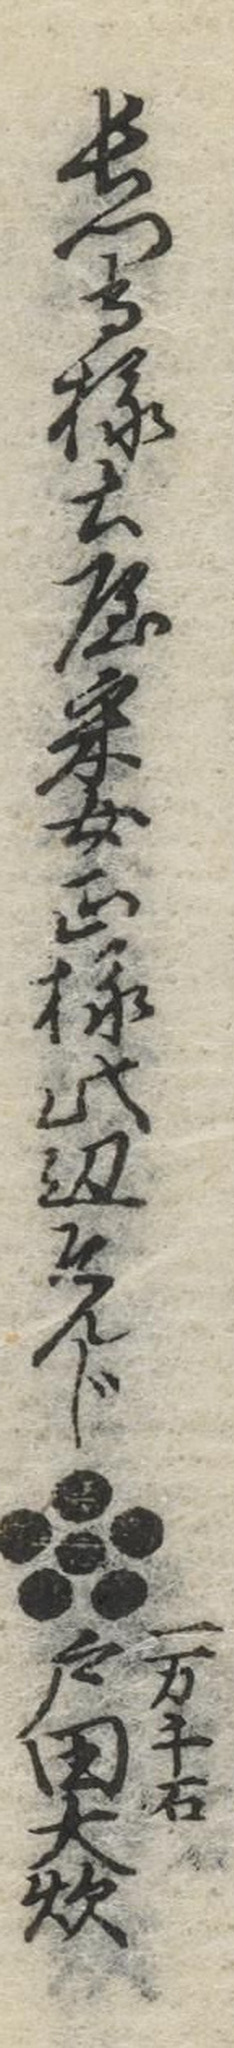長門守様土屋采女正様此辺そんじ戸田大炊
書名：江戸御屋鋪方町方共　地震類焼場所巨細書之寫　潰家潰土蔵共取調附街道筋近在迄
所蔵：東京大学地震研究所図書室 Earthquake Research Institute Library, The University of Tokyo, JAPAN
